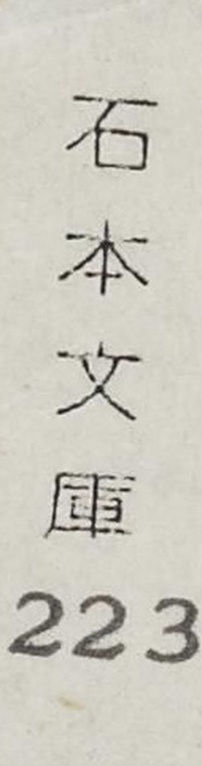石本文庫

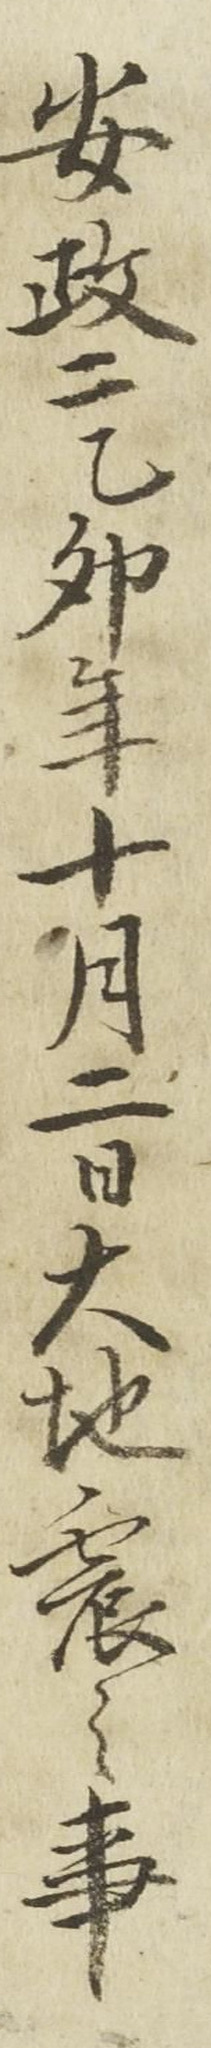安政二乙卯年十月二日大地震之事
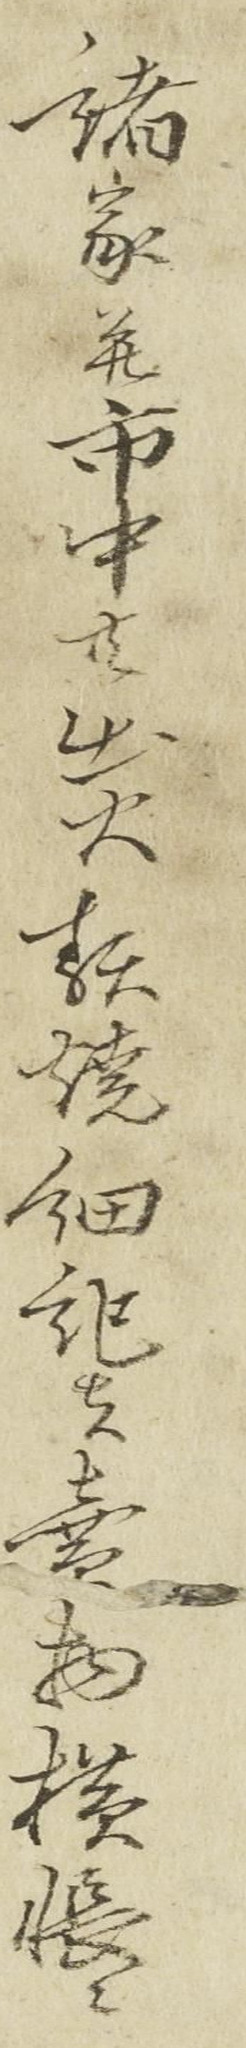諸家并市中共出火類焼細記者売物横帳ニ
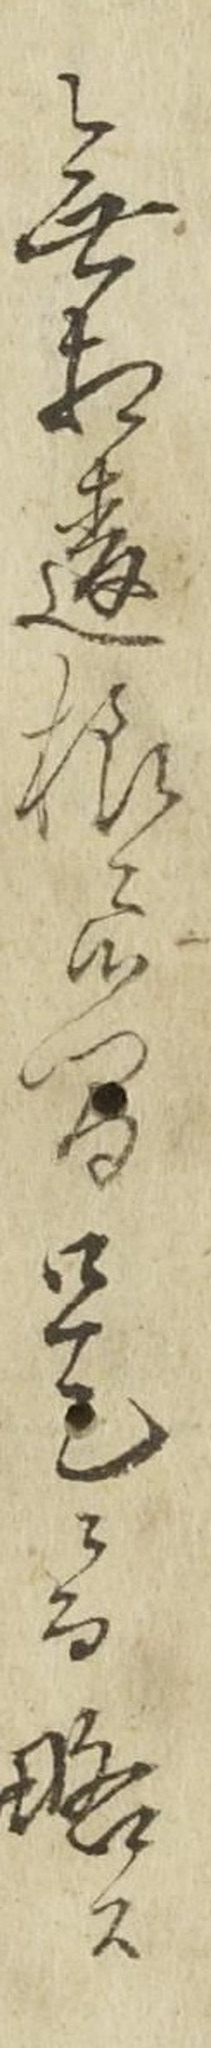之無相違様ニ候間是ニテ略ス
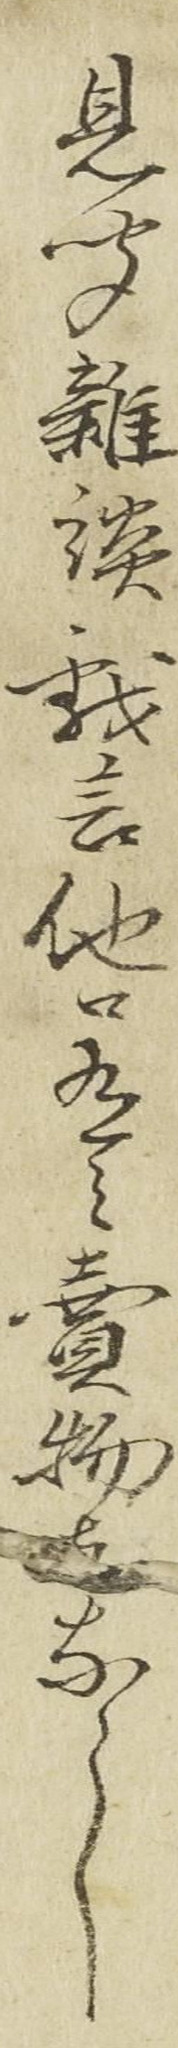見聞雑談戯言他口有之売物者なし
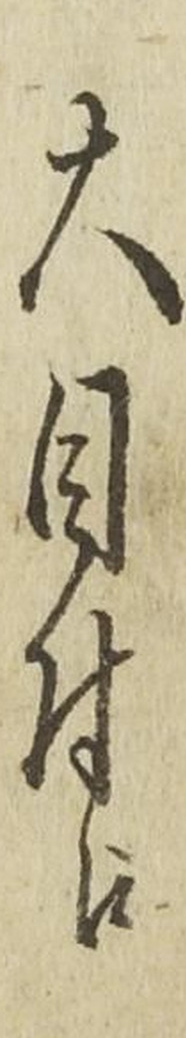大目付江
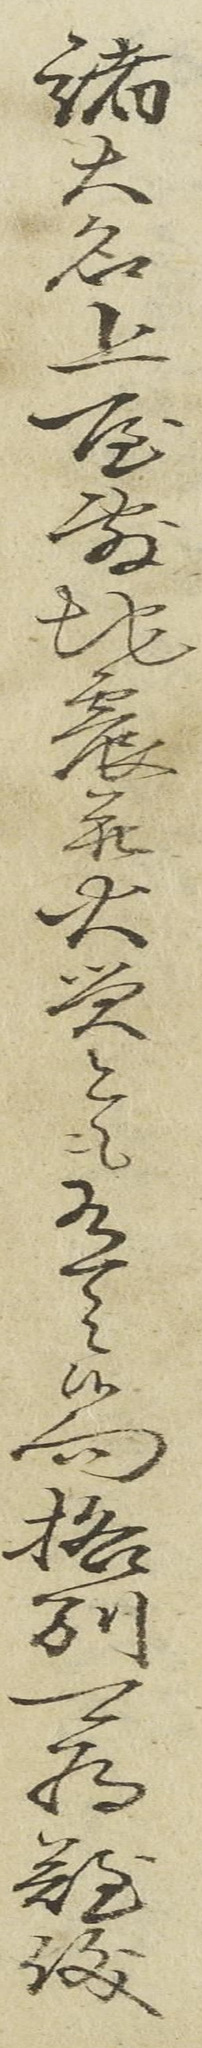諸大名上屋敷地震并火災とも有之候向格別可為難儀
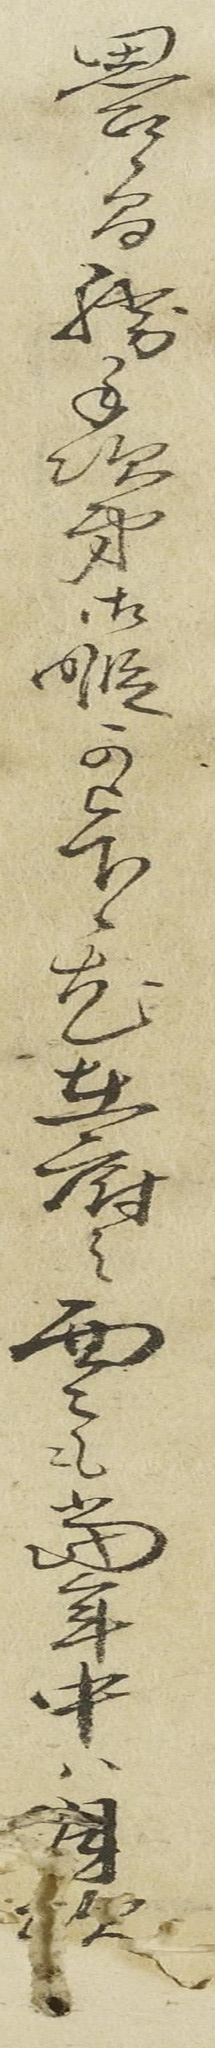思召候間勝手次第御暇可被下候尤在府之面々も当年中ハ月次
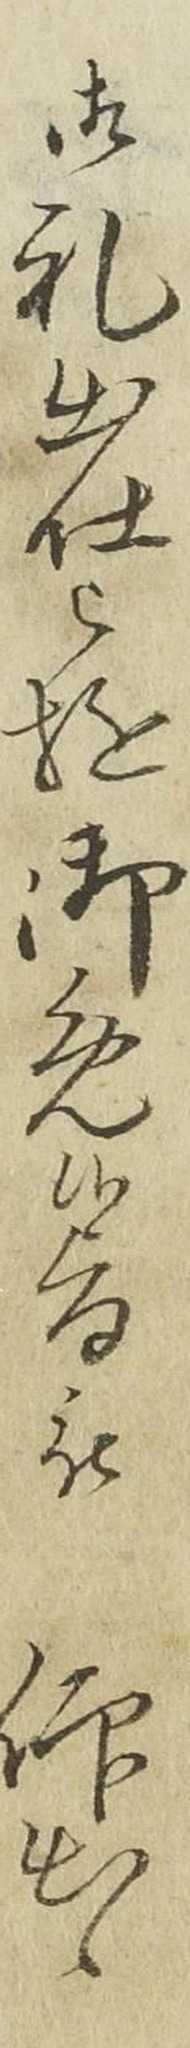御礼出仕被遊御免候旨被仰出候
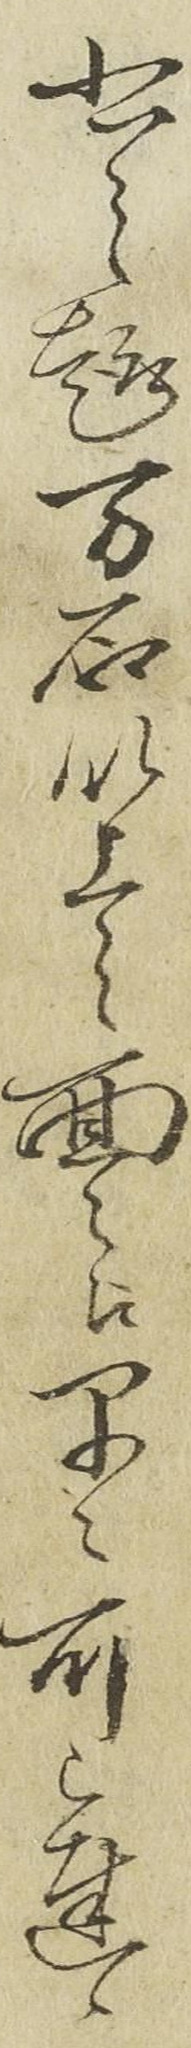右之趣万石以上之面々江早々可被達候
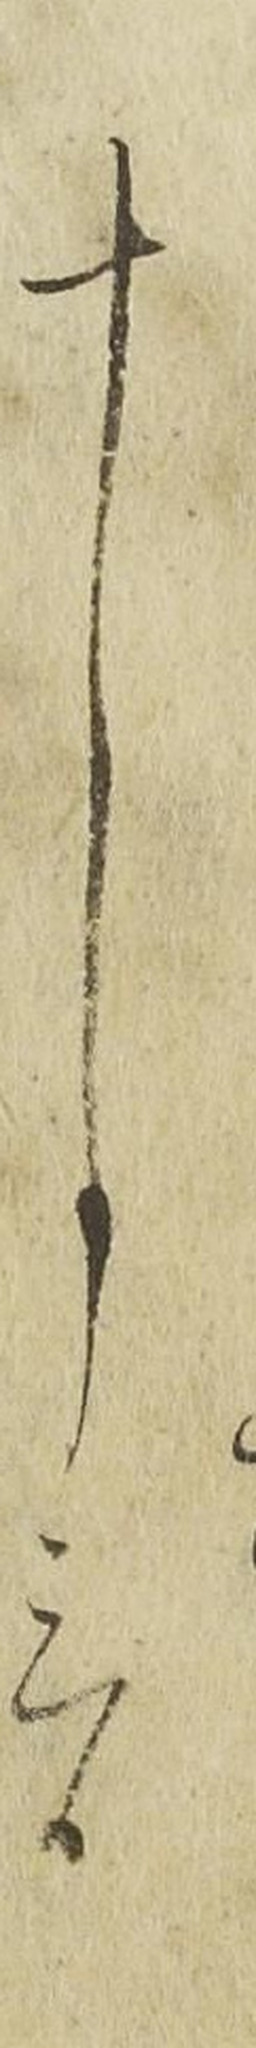十月三日
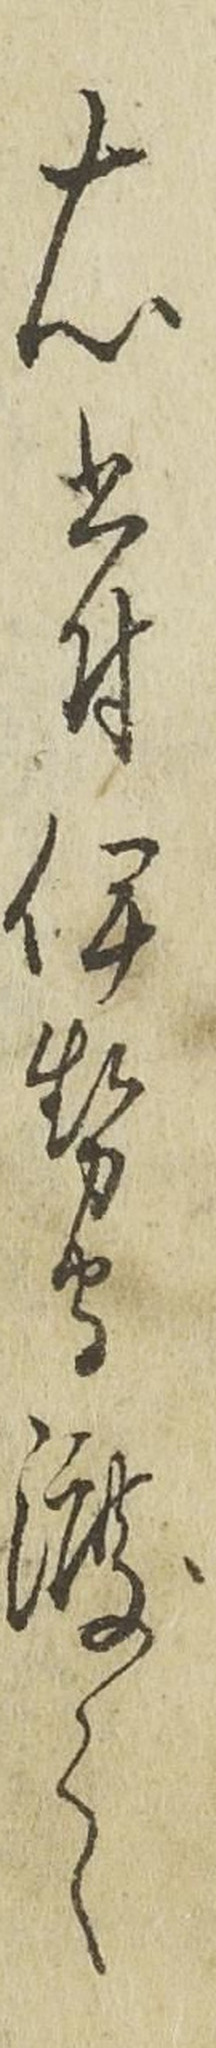右書付伊勢守渡之
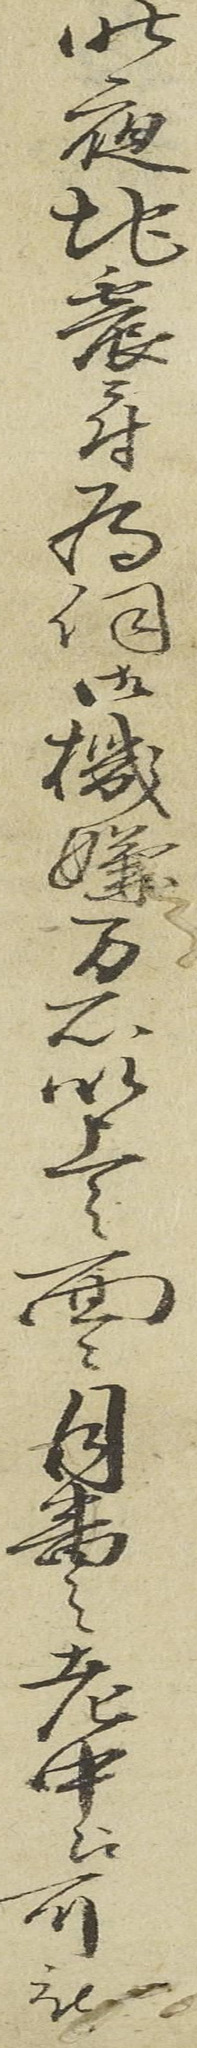昨夜地震ニ付為伺御機嫌万石以上之面々月番之老中江可被

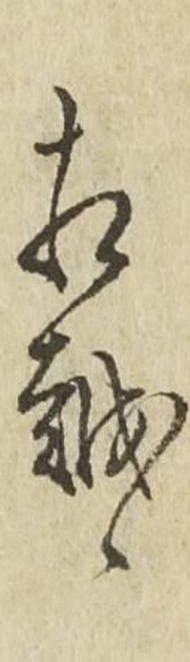相越候
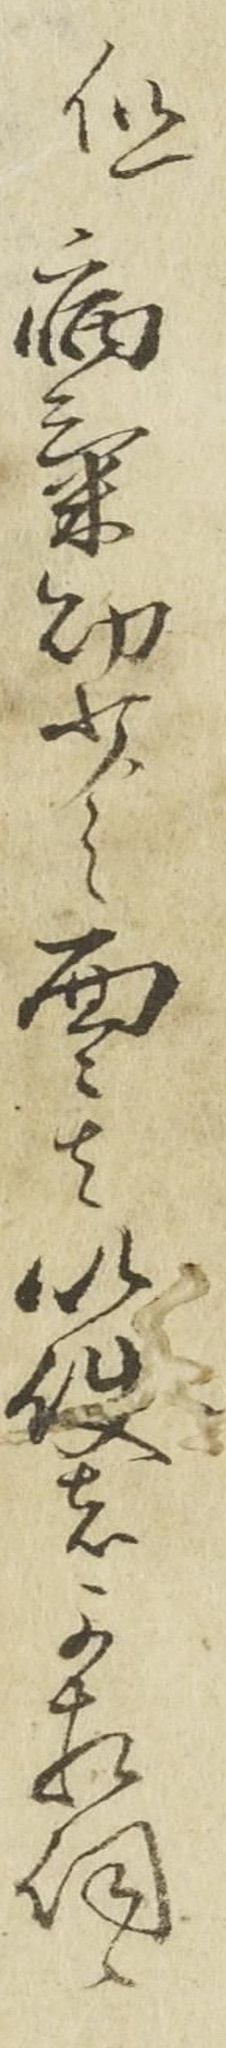但病氣幼少之面々者以使者可相伺候
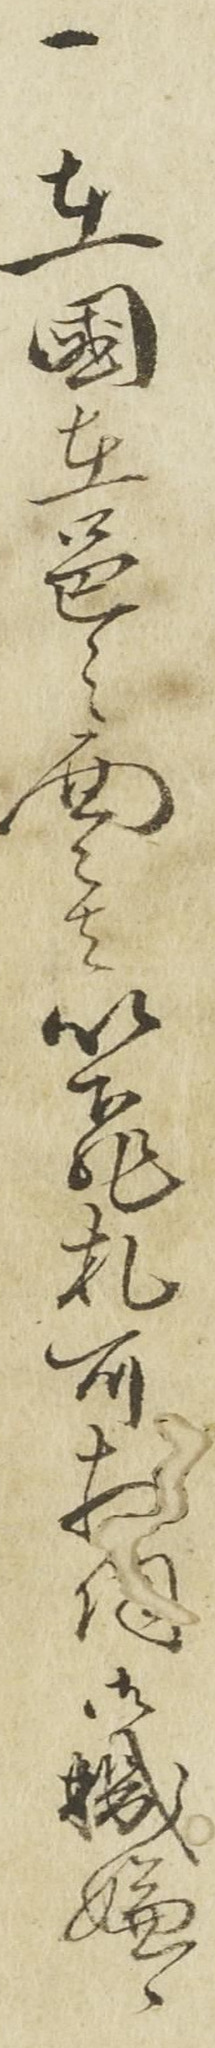在国在邑之面々者以飛札可相伺御機嫌候
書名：安政二乙卯年十月二日大地震之事
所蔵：東京大学地震研究所図書室 Earthquake Research Institute Library, The University of Tokyo, JAPAN
